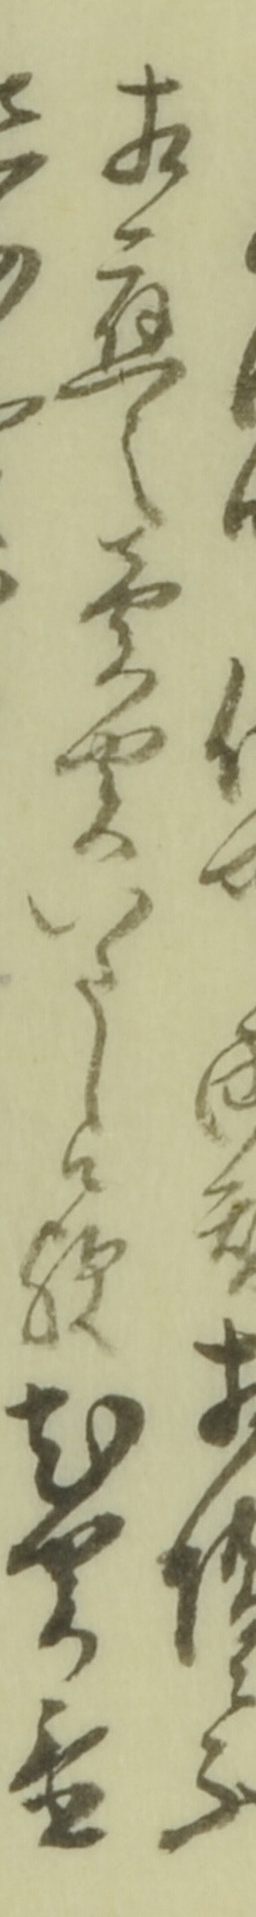相応之売買いたし候歟尤買置
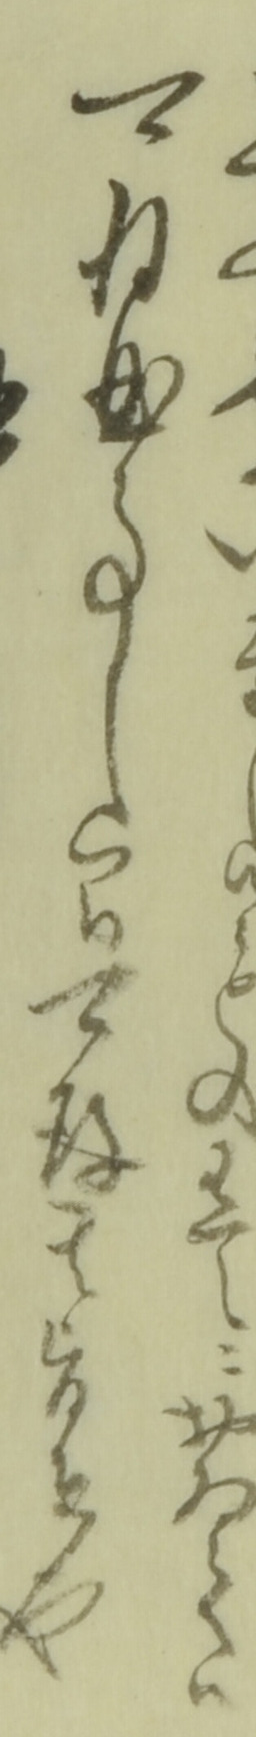可為曲事候間可存其旨者也
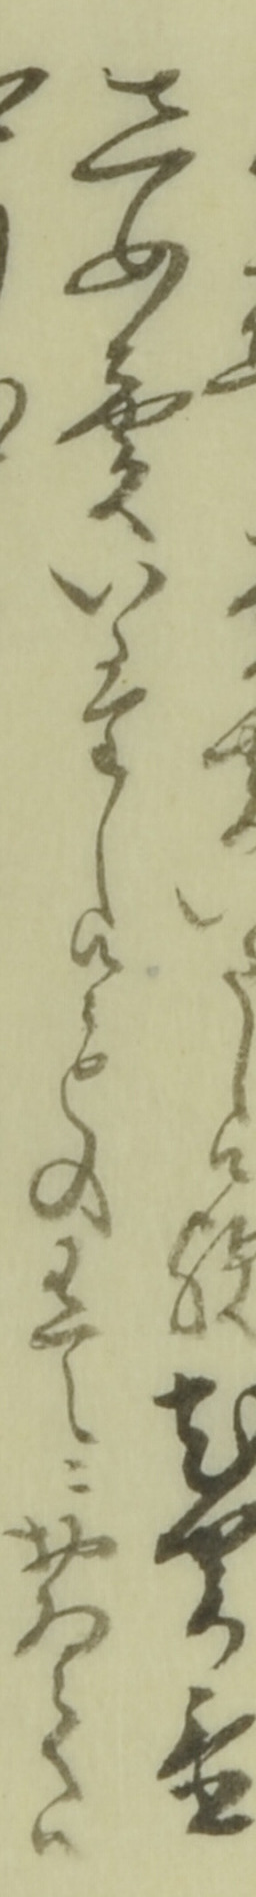しめ売いたし候もの有之ニおゐては
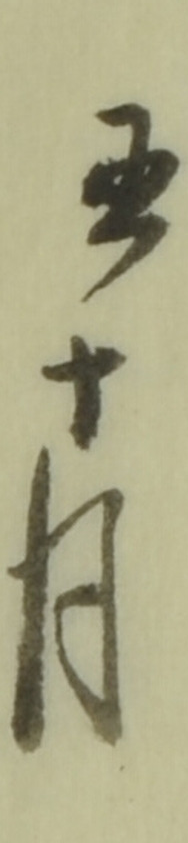丑十月

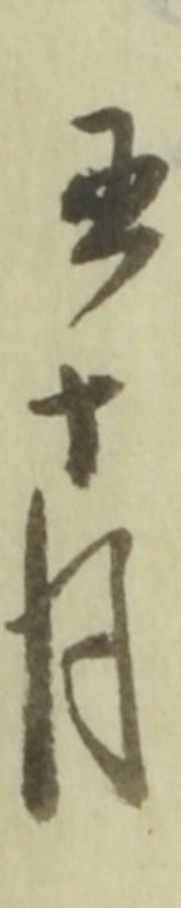丑十月
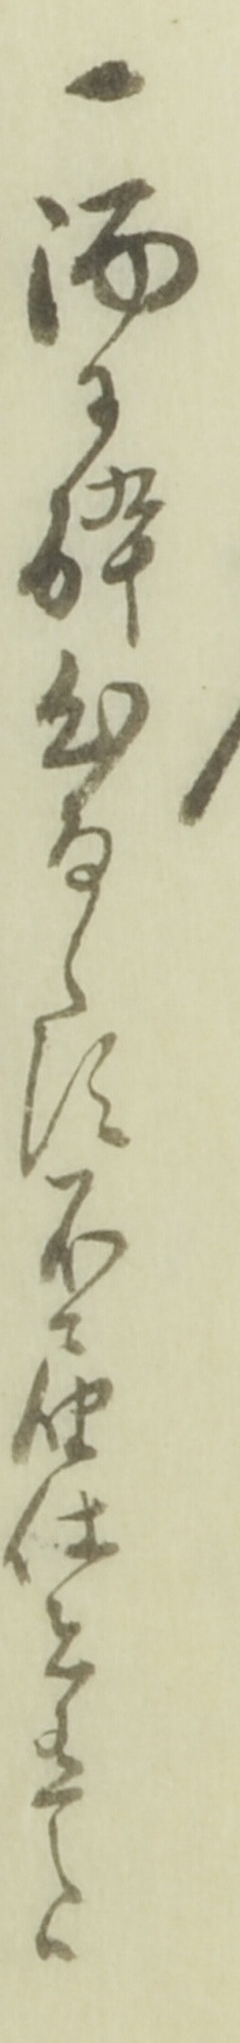一酒に酔心ならす不届仕者有之候
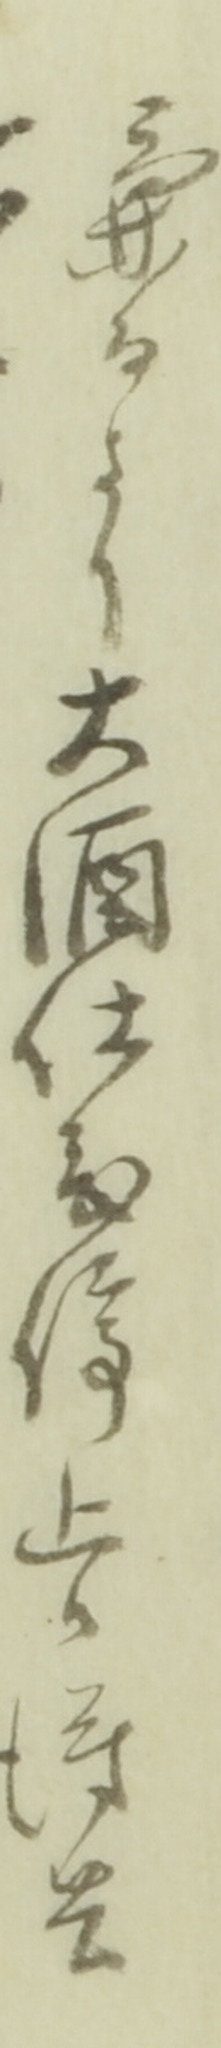兼而より大酒仕義停止候得共
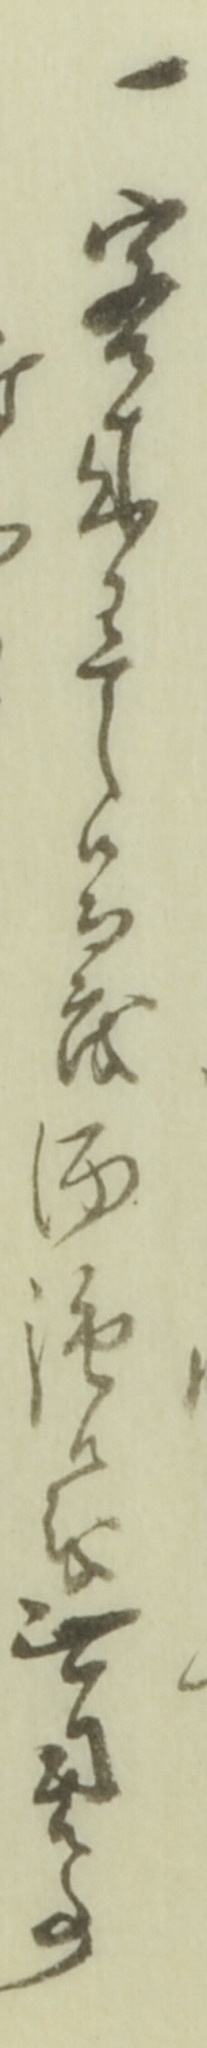一客来有之候而も酒強候義無用候事
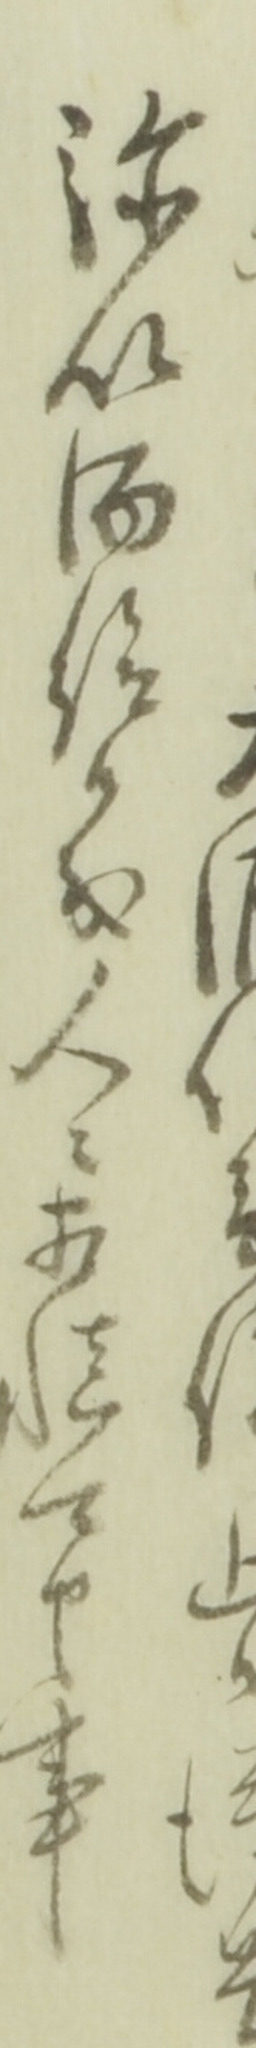弥以酒給候義人々相慎可申事
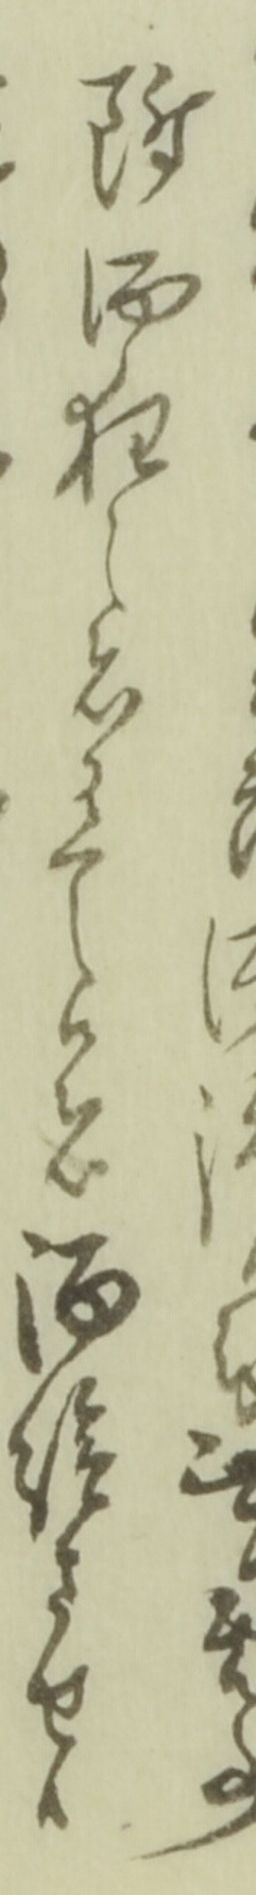附酒狂之者有之候は酒給させ候
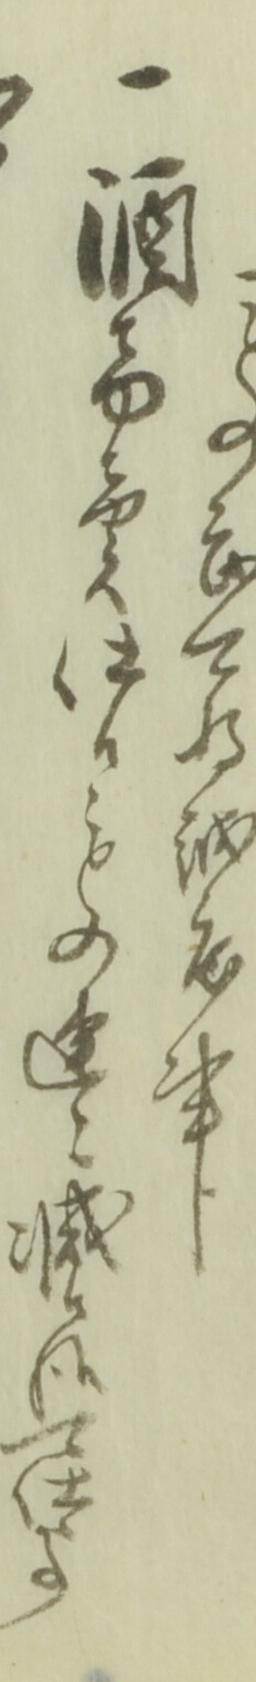一酒商売仕候もの連々減候様可仕候事
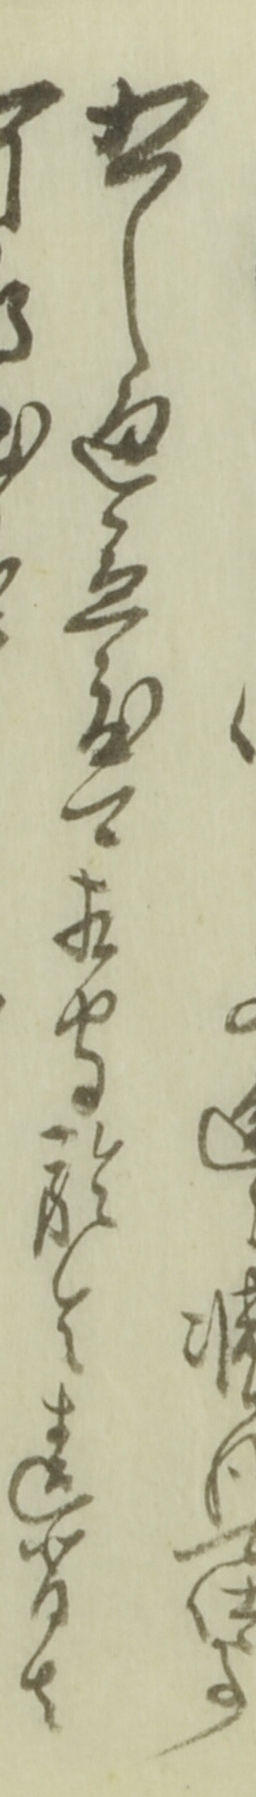右之通急度可相守於令違背は
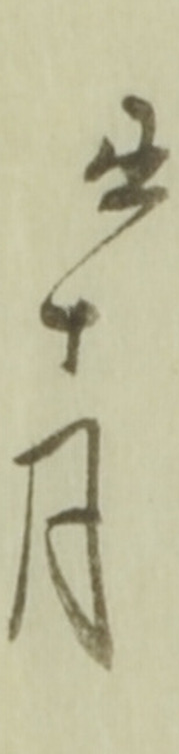丑十月
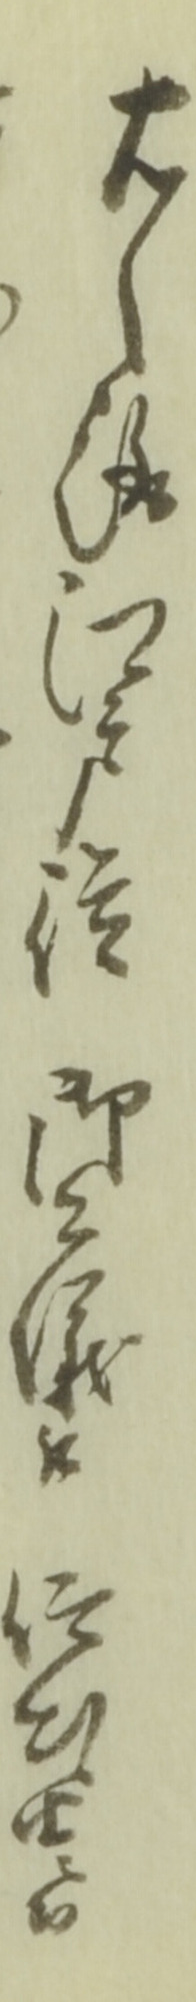右之趣江戸従御公儀被仰出候由ニ而
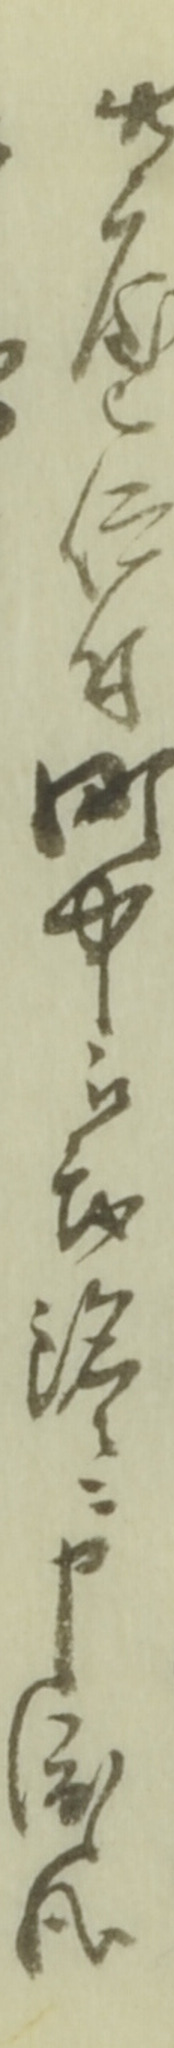此度被仰付町中江茂銘々ニ申渡候様
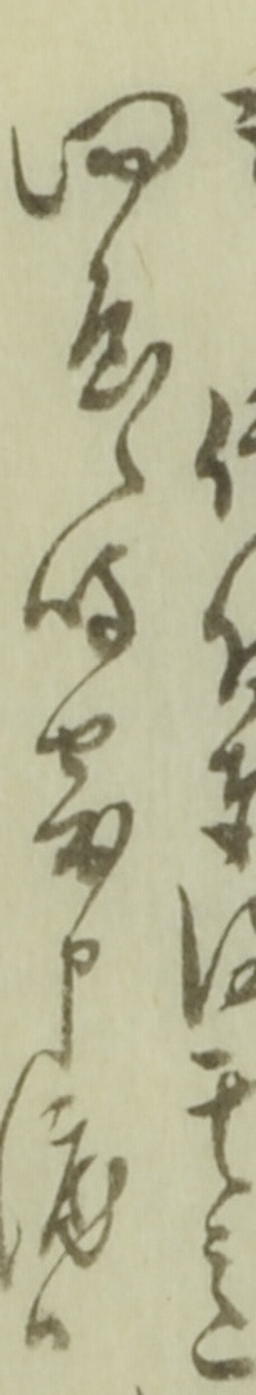問屋へ呼寄申渡候
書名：御公儀様御領主様御触書控
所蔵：伊那市立高遠町図書館・合同会社AMANE
